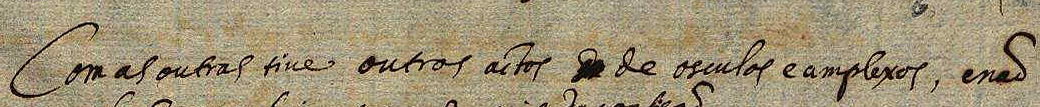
Com as outras tiue outros actos _ de osculos e amplexos, e naõ
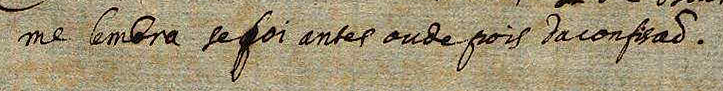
me lembra se foi antes ou depois da confisaõ.
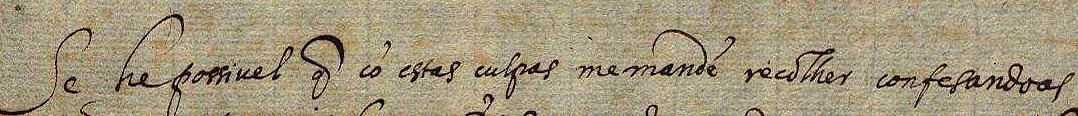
Se he possiuel q̄ cō estas culpas me mandē recolher confesandoas
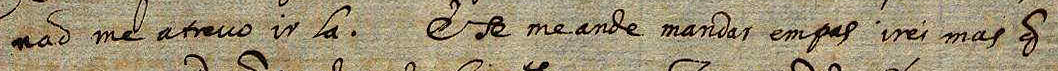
naõ me atreuo ir la. E se me ande mandar em pas irei mas q̄
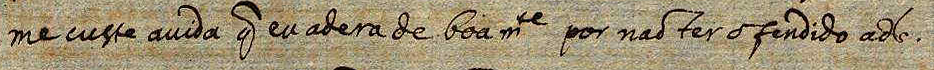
me custe a uida q̄ eu a dera de boa mte por naõ ter ofendido a ds̄.
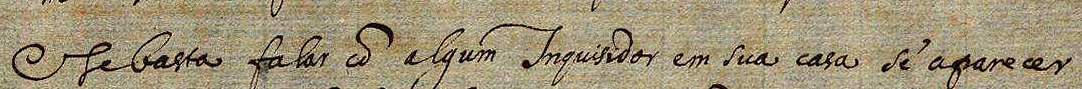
E se basta falar cō algum Inquisidor em sua casa sē aparecer
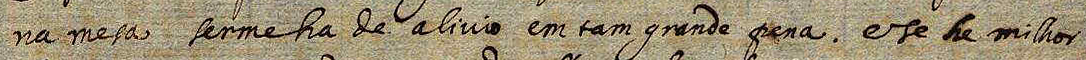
na mesa sermeha de aliuio em tam grande pena. e se he milhor
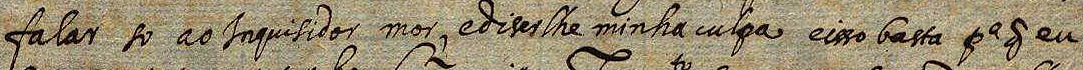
falar so ao Inquisidor mor, e diserlhe minha culpa, e isso basta pa q̄ eu
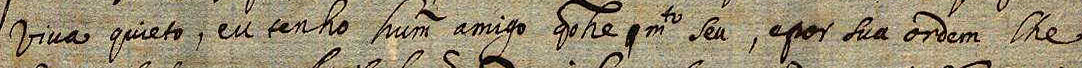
viua quieto, eu tenho hum̄ amigo q̄ o he mto seu, e por sua ordem lhe
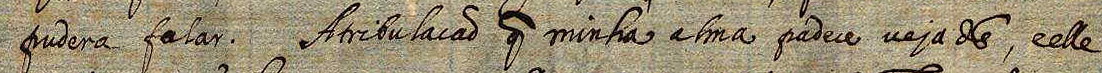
pudera falar. A tribulaçaõ q̄ minha alma padece ueja ds̄, e elle
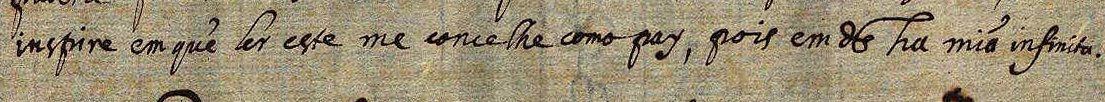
inspire em quē ler este me concelhe como pay, pois em ds̄ ha miā infinita.
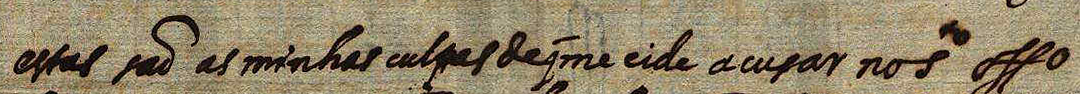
estas são as minhas culpas de q̄ me eide acusar no sto offo
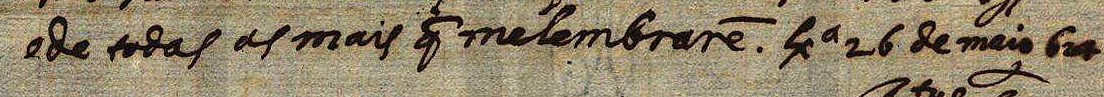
e de todas as mais q̄ me lembrarē. lxa 26 de maio 624
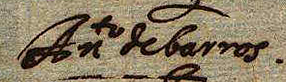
Anto de barros.
